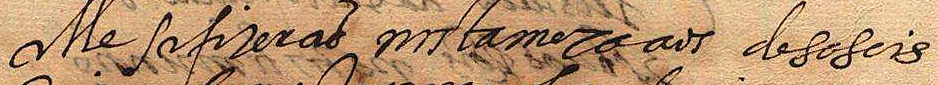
elle se fizeraõ nesta meza aos desaseis
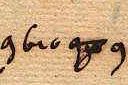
9bro _ 89
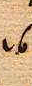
16
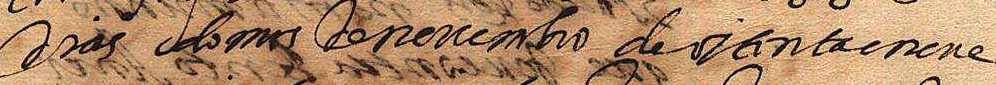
dias do mes de nouembro de oitenta e noue
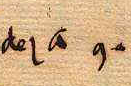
dezo 9.
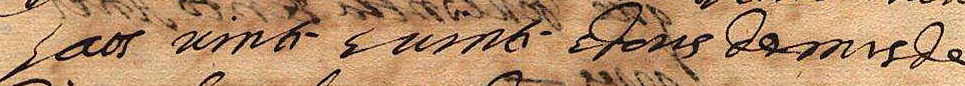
E aos uinte E uinte E dous do mes de
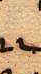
22
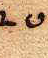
20
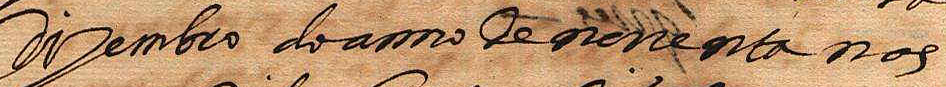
dizembro do anno de nouenta nos
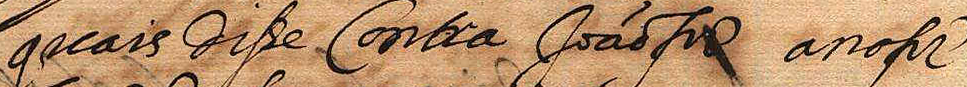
quais disse Contra Joaõ frz̄ anofrz̄
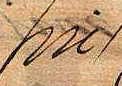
hius
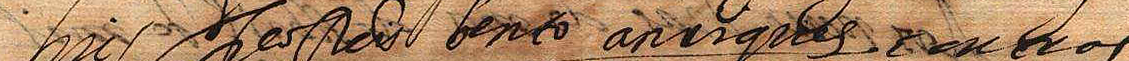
frco Rois̄ bento anriques e outras
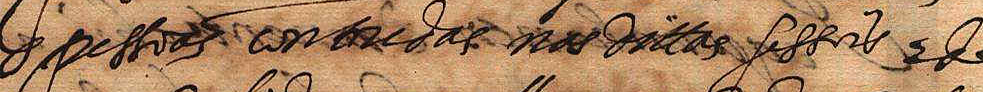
pessoas conteudas nas dittas sessoīs E de
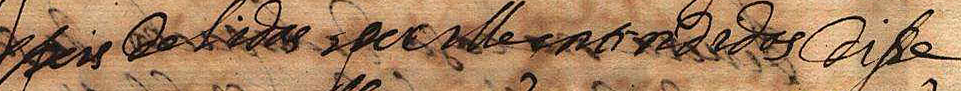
pois de lidas E per elle entendidas disse
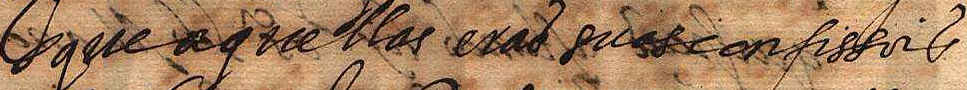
que aquellas eraõ suas confissois̄
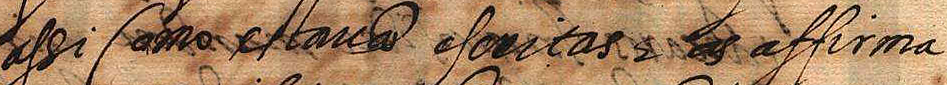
assi Como estauaõ escritas E as affirma
